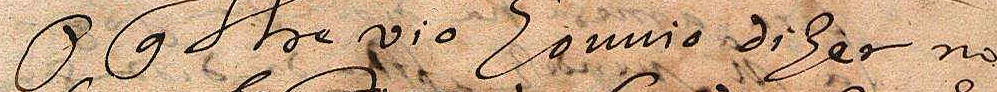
O q̅ lhe vio E ouuio dizer no
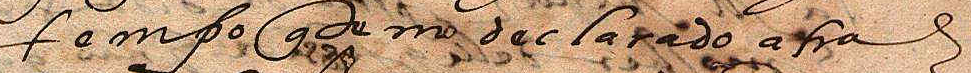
tempo q̅ tem declarado atras
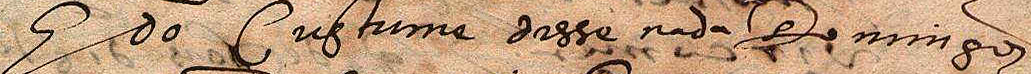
E do Custume disse nada Domingos
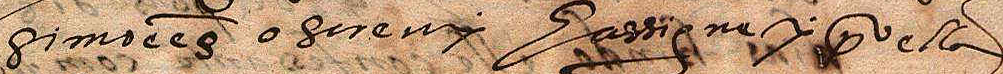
Simõees o screuy E assigney p̅o ella
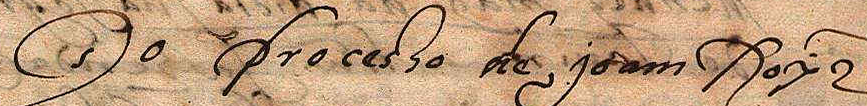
Do processo de joam Roy̅z
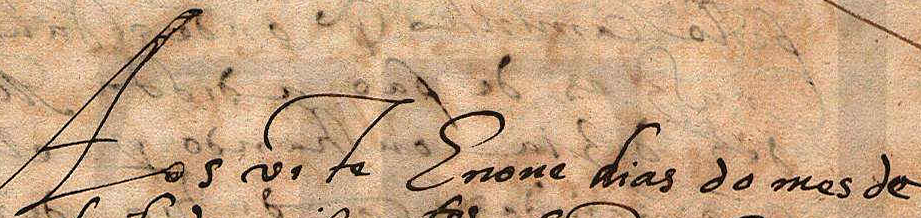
Aos v̅ite E noue dias do mes de
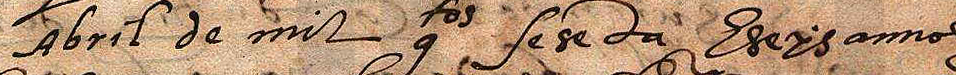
Abril de miL qtos ses̅eta E seys annos
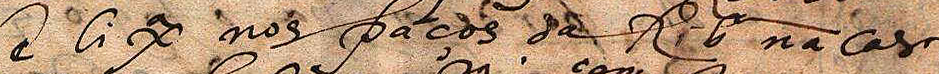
e̅ lixa nos paços da Ribra na casa
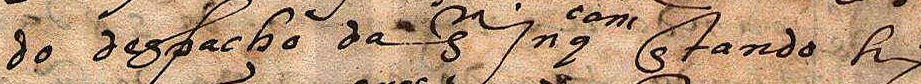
do despacho da Sta Jnqcam stando hy
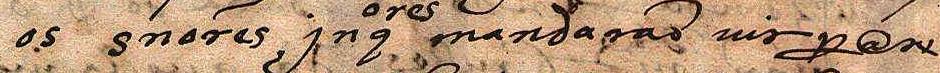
os snor̅es Jnqores mandarão uir ꝑ.āte
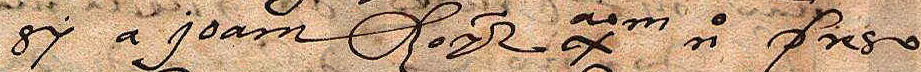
sy a joam Roy̅z xam no preso
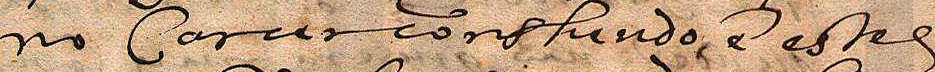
no Carcer contheudo e̅ estes
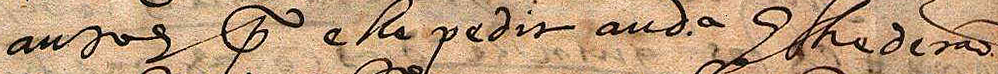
autos p̅o elle pedir aud.a E lhe derão
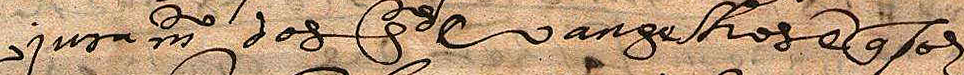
juramto dos S̄tos euangelhos e̅ q̅ pos
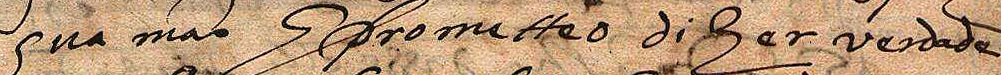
sua mão E prometteo dizer verdade
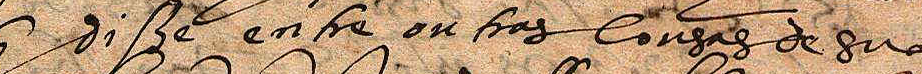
E disse entre outras cousas de sua
